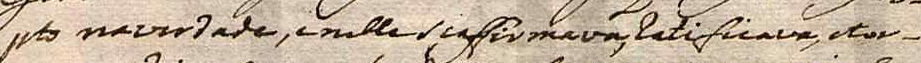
pto na verdade, e nelle se affirmava, Ratificava, e tor
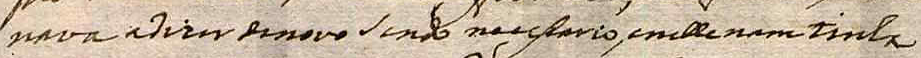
nava a dizer de novo sendo necessario, e nelle nam tinha
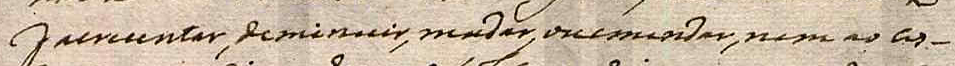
q̄ acrecentar, deminuir, mudar, ou emendar, nem ao cos
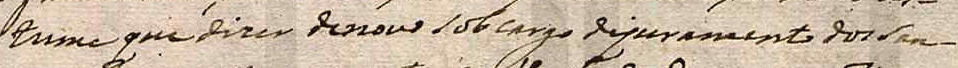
tume que dizer de novo sob cargo do juramento dos san
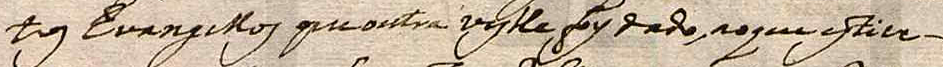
tos Evangelhos que outra ves lhe foy dado, ao que estive
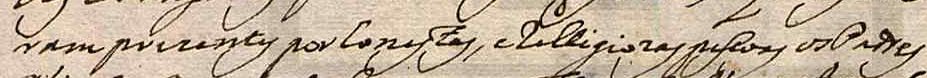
ram prezentes por honestas, e Relligiozas pessoas os Padres
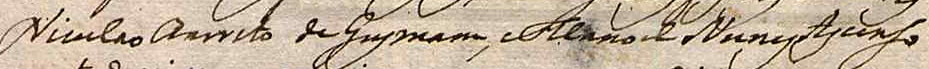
Niculao Barreto de Gusmam, e Manoel Nunes Ascenso
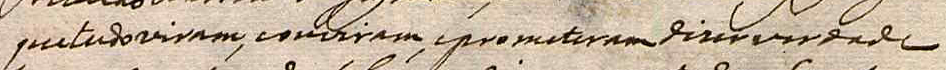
que tudo viram, e ouviram e prometeram dizer verdade
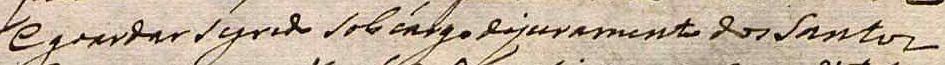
e goardar segredo sob cargo do juramento dos Santos
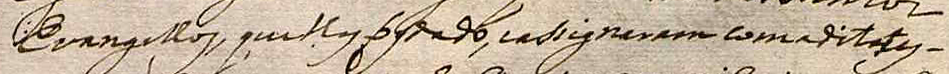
Evangelhos, que lhes foy dado, e assignaram com a dita tes
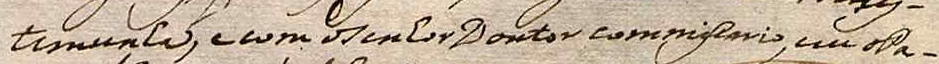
temunha, e com o senhor Doutor commissario, e eu o Pa
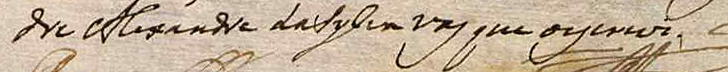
dre Alexandre da Sylva vas que o escrevi.
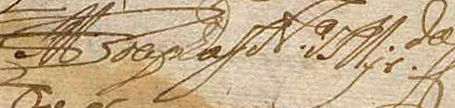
Jozeph da sil.a Myr.da
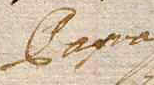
Payva
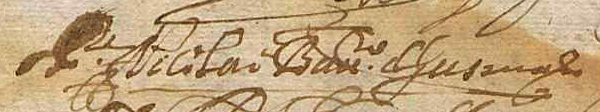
o P.e Nicolao Barr.to d Gusmaõ
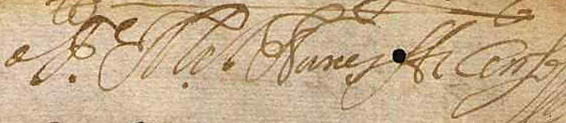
o P.e Mel. Nunes AsCenso
